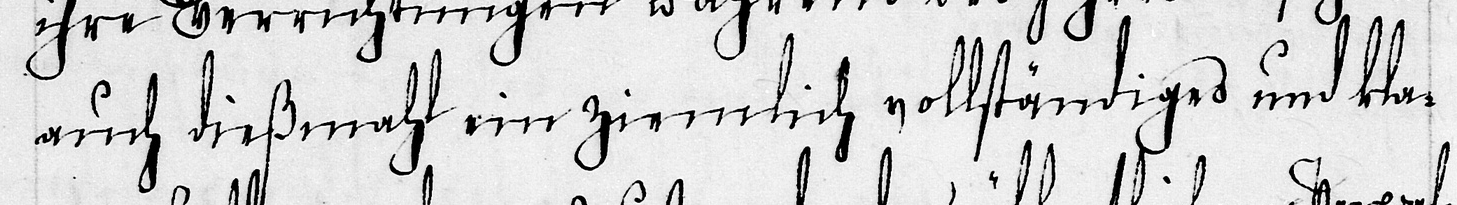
auch dießmahl ein ziemlich vollständiges und kla¬
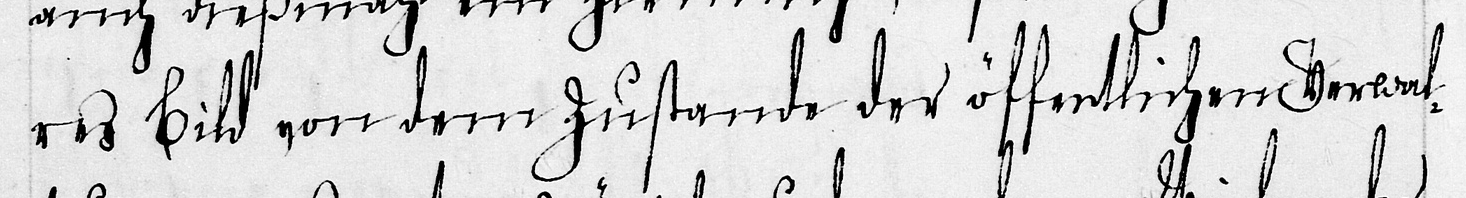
res Bild von dem Zustande der öffentlichen Verwal¬
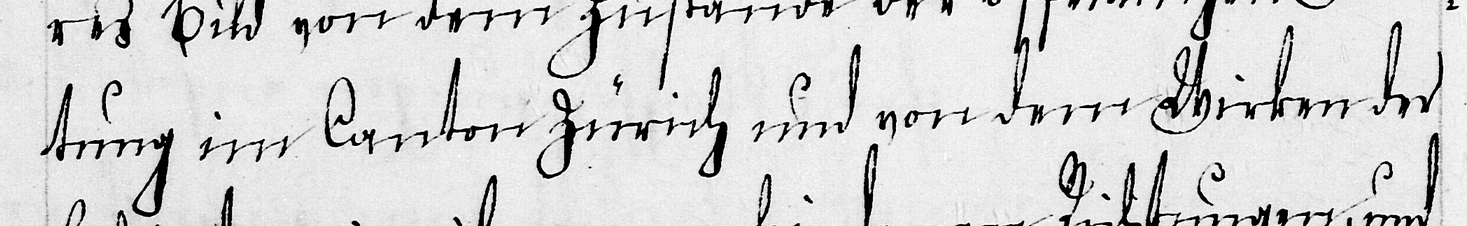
tung im Canton Zürich und von dem Wirken der
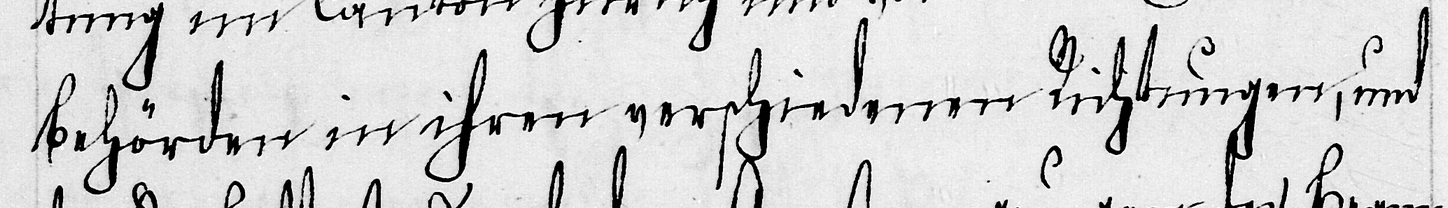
Behörden in ihren verschiedenen Richtungen, und
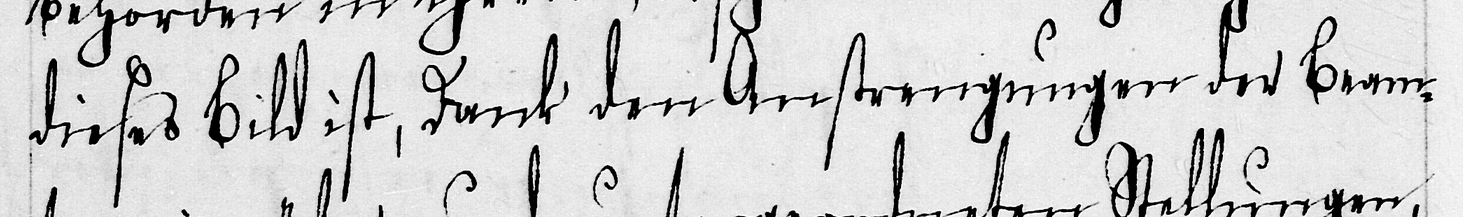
dieses Bild ist, Dank den Anstrengungen der Beam¬
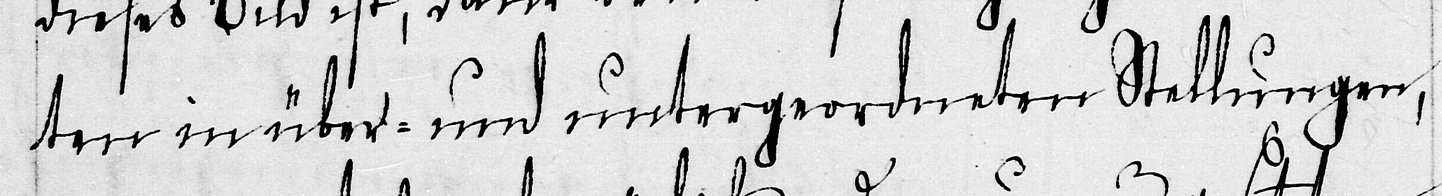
ten in über- und untergeordneten Stellungen,
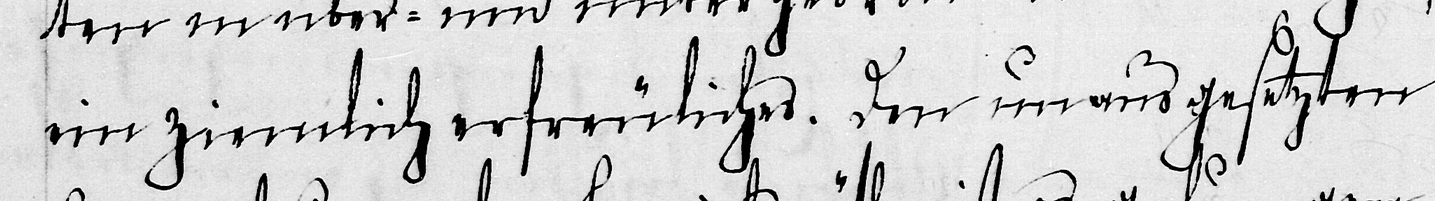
ein ziemlich erfreuliches. Den unausgesetzten
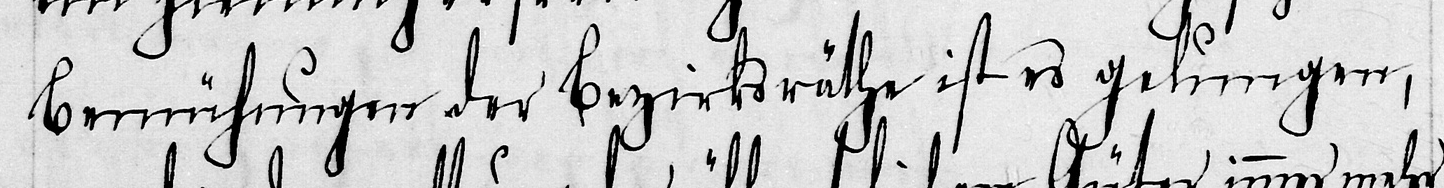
Bemühungen der Bezirksräthe ist es gelungen,
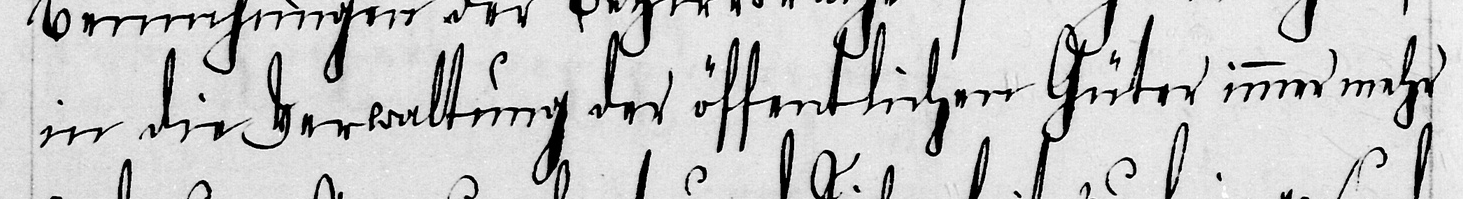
in die Verwaltung der öffentlichen Güter immer mehr
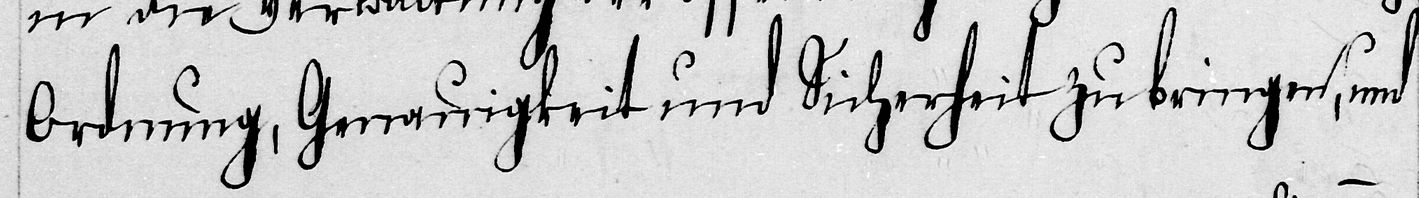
Ordnung, Genauigkeit und Sicherheit zu bringen, und
